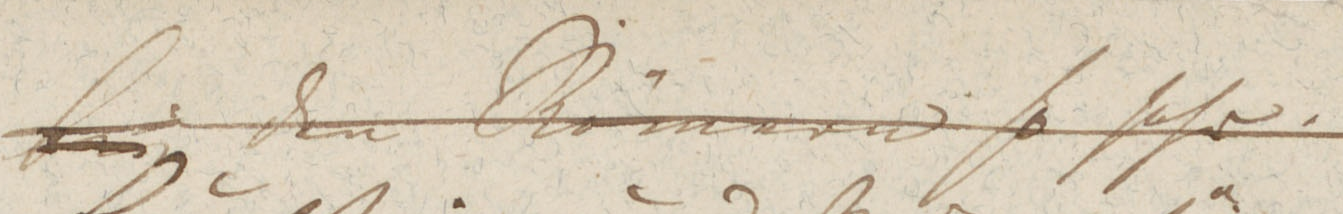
Bei den Römern so sehr
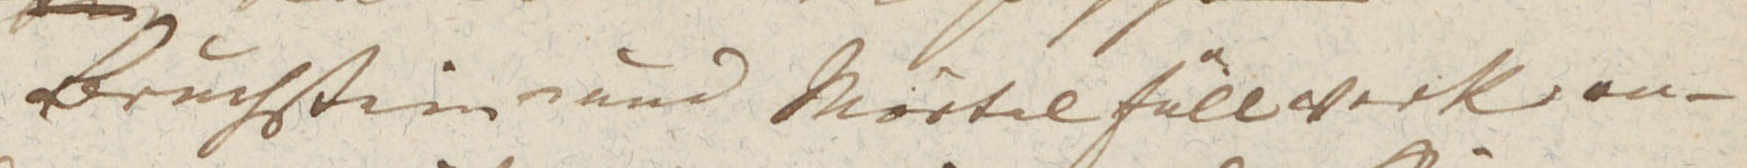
Bruchstein- und Mörtelfüllwerk an-
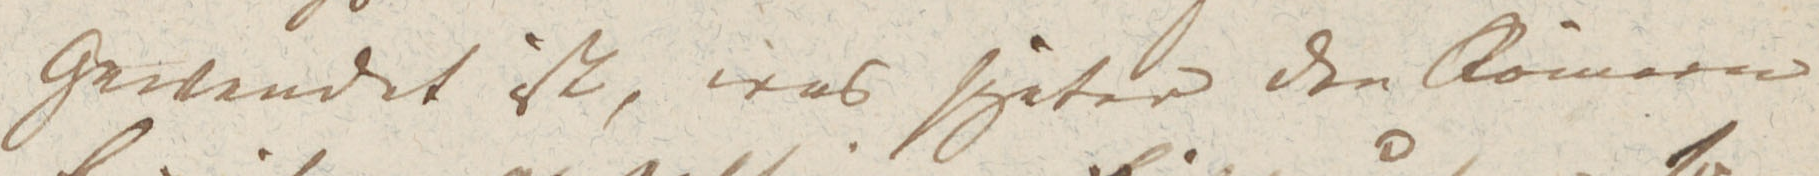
gewendet ist, was später den Römern
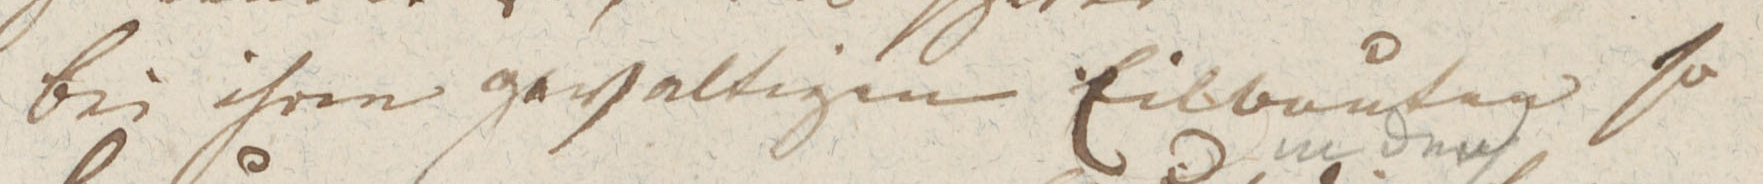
bei ihren gewaltigen Eilbauten so
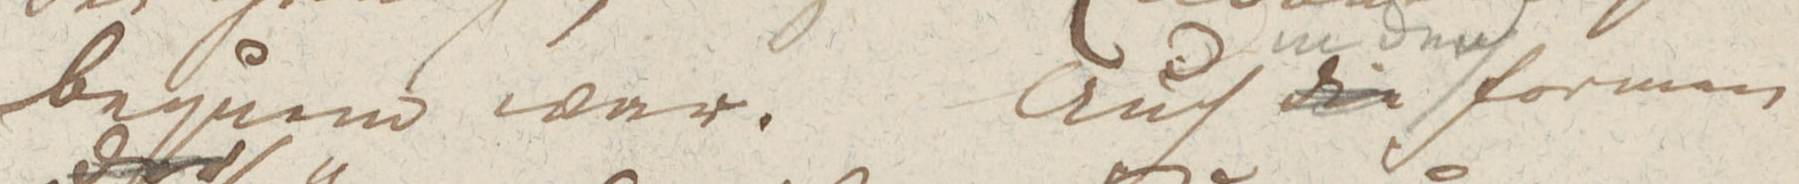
bequem war. Auch die in den Formen
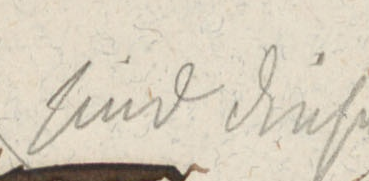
diese dieser
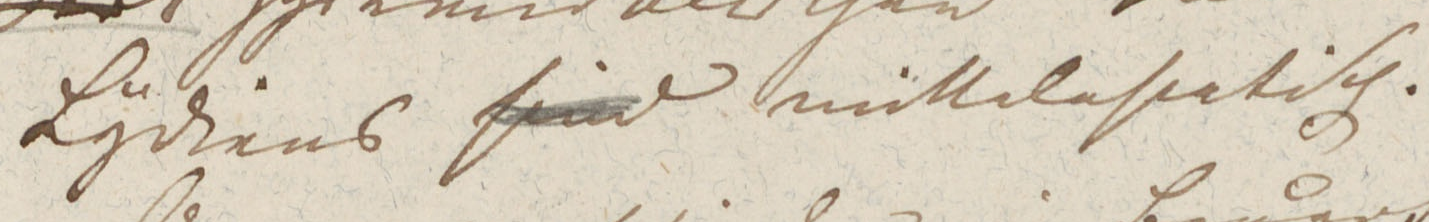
Lydiens sind mittelasiatisch. –
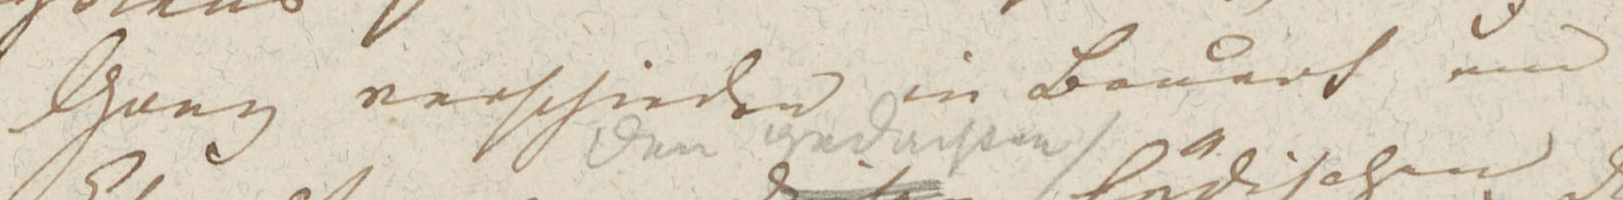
Ganz verschieden in Bauart und
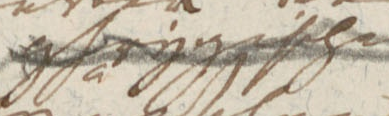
und Phygischen
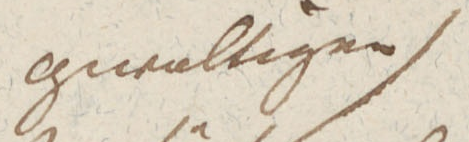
gewaltigen
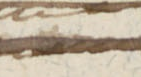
aus festgefügten
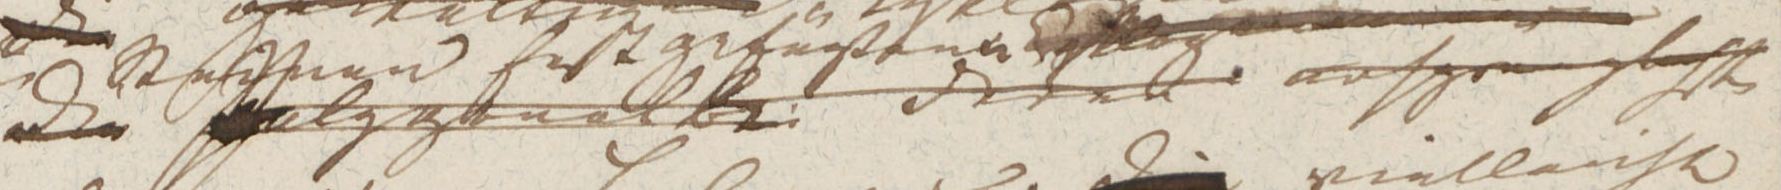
Steinen festgefügten Cyklopenmauern ursprünglichste
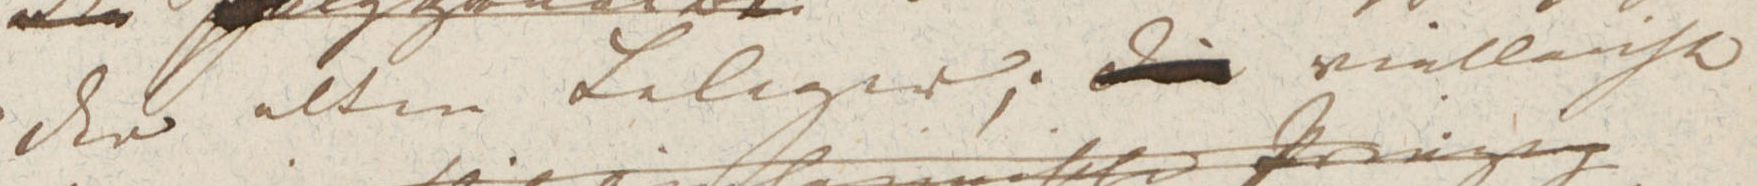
der alten Leleger; die vielleicht
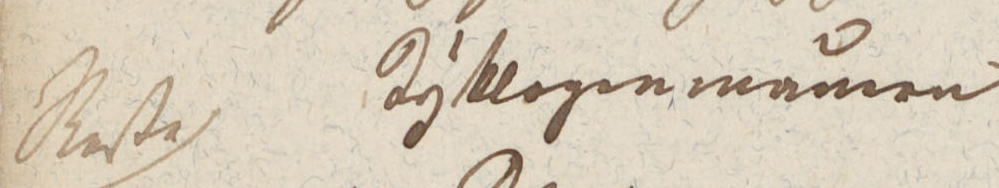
Reste des in Kleinasien
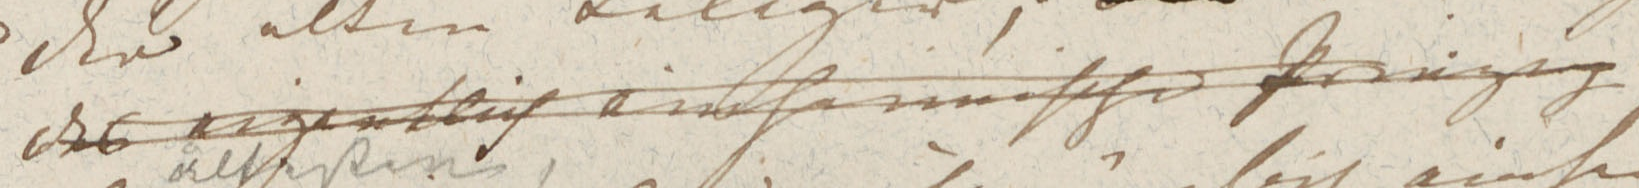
das eigentlich einheimische Prinzip
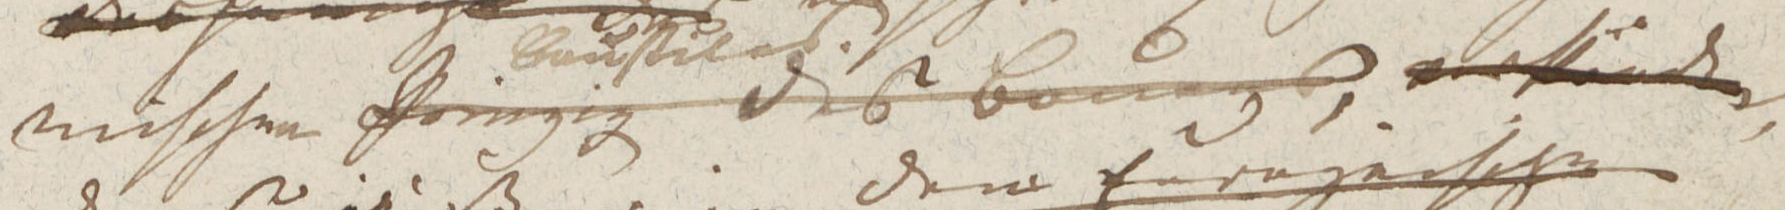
mischen Prinzip des Bauens, Baustiles. verkünden,
